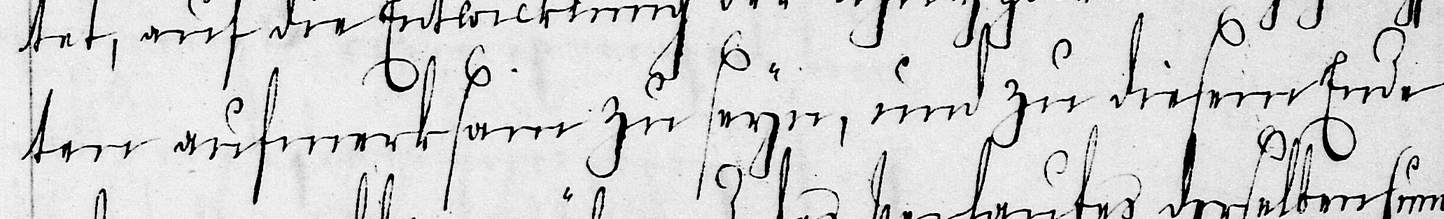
ten aufmerksam zu seyn, und zu diesem Ende
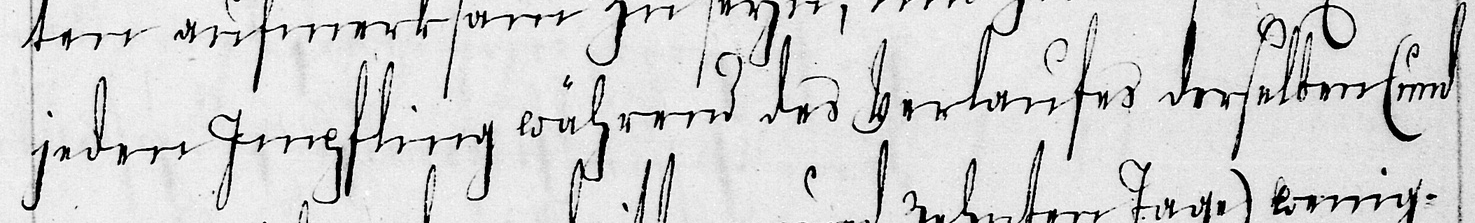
jeden Impfling während des Verlaufes derselben (und
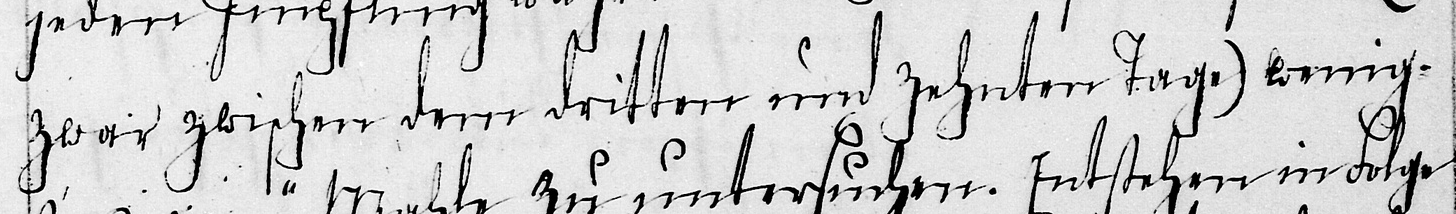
zwar zwischen dem dritten und zehnten Tage) wenig¬
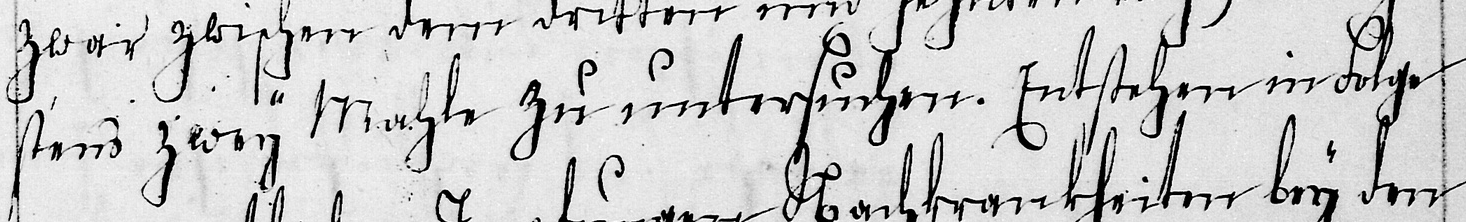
stens zwey Mahle zu untersuchen. Entstehen in Folge
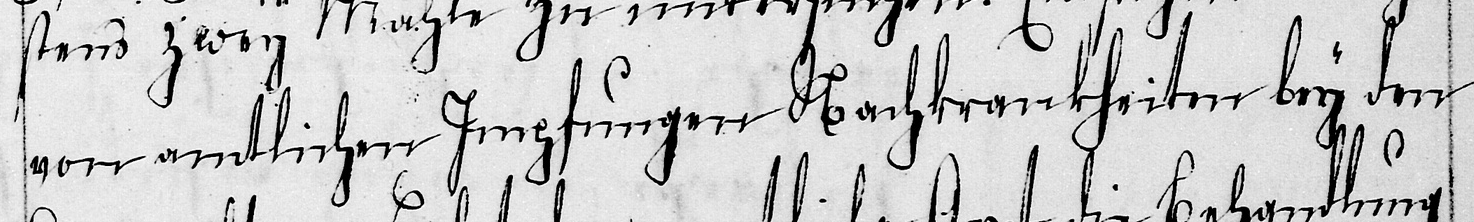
von amtlichen Impfungen Nachkrankheiten bey den
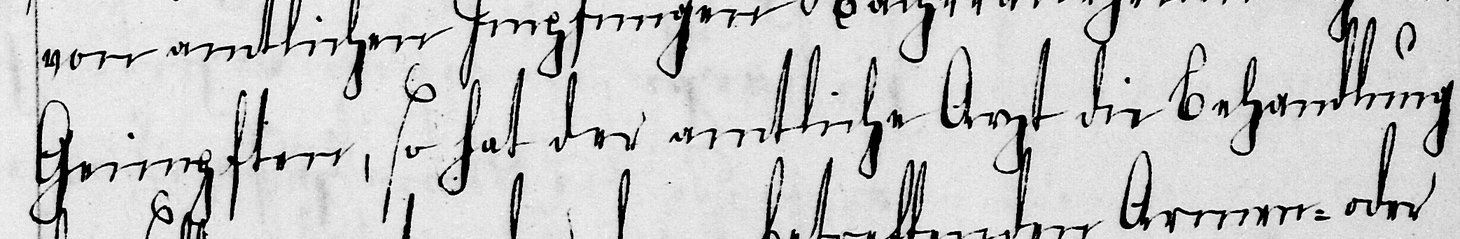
Geimpften, so hat der amtliche Arzt die Behandlung
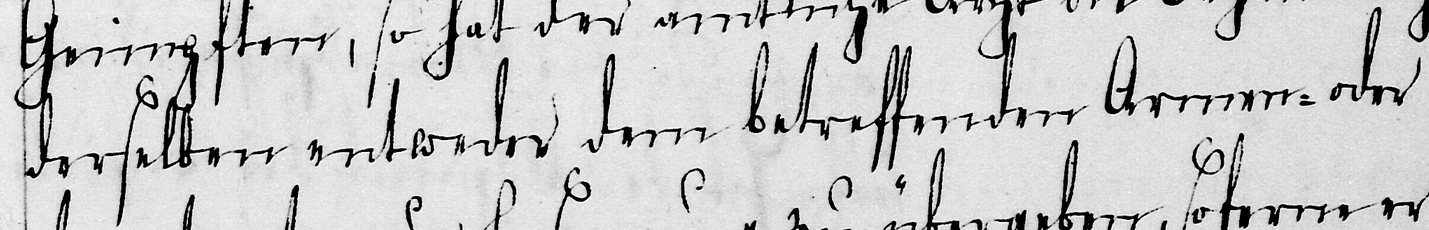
derselben entweder dem betreffenden Armen- oder
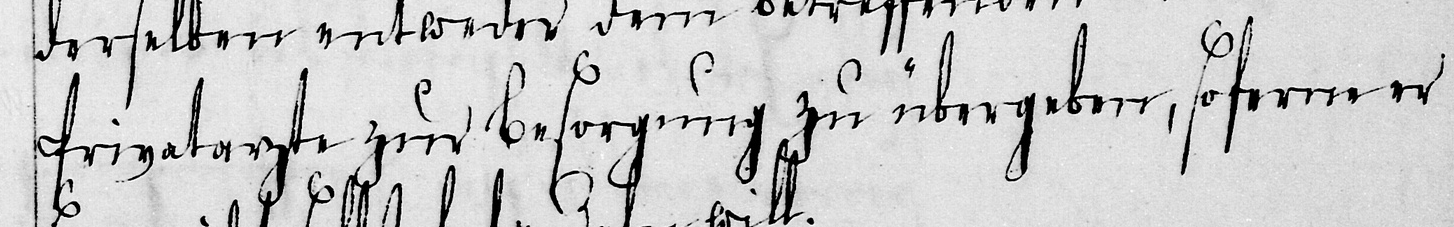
Privatarzte zur Besorgung zu übergeben, soferne er
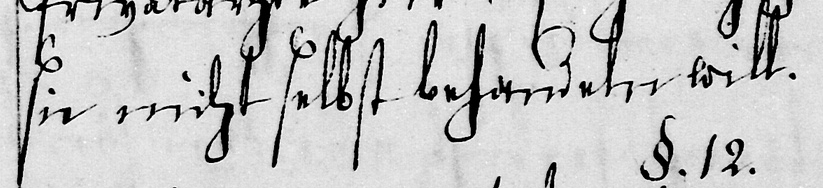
sie nicht selbst behandeln will.
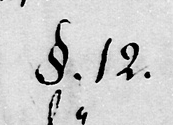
§. 12.
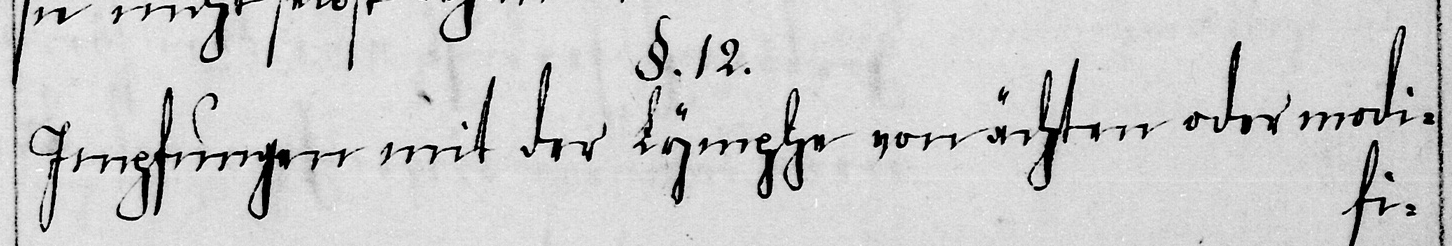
Impfungen mit der Lymphe von ächten oder modi-
